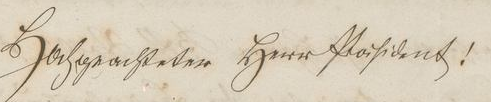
Hochgeachteter Herr Präsident!
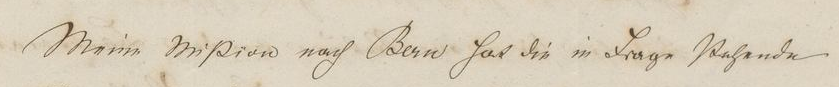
Meine Mißion nach Bern hat die in Frage stehende
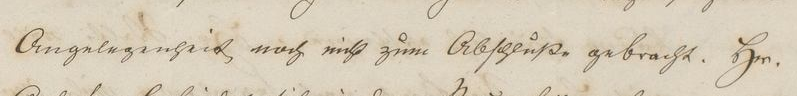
Angelegenheit noch nicht zum Abschluße gebracht. Hr.
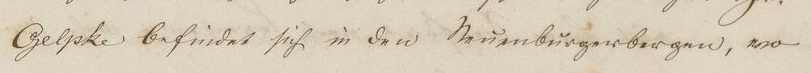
Gelpke befindet sich in den Neuenburgerbergen, wo
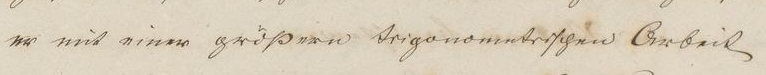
er mit einer größern trigonometrische Arbeit
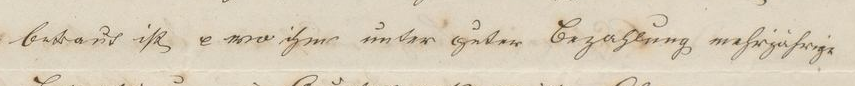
betraut ist & wo ihm unter guter Bezahlung mehrjährige
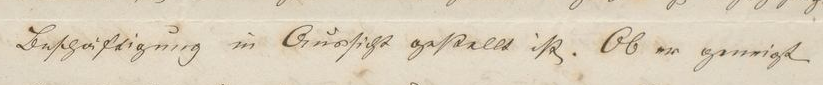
Beschäftigung in Aussicht gestellt ist. Ob er geneigt
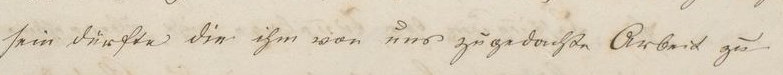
sein dürfte die ihm von uns zugedachte Arbeit zu
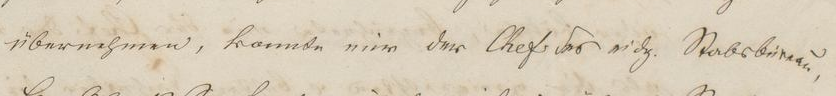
übernehmen, konnte mir der Chef des eidg. Stabsbureau,
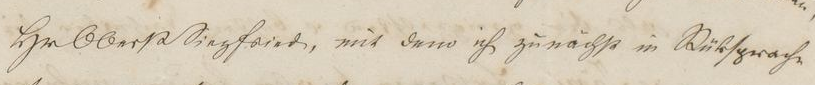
Hr. Oberst Siegfried, mit dem ich zunächst in Rüksprache
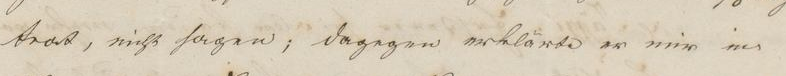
trat, nicht sagen; dagegen erklärte er mir in
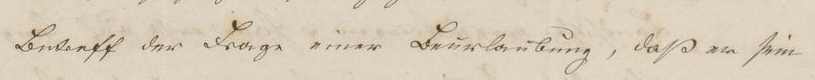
Betreff der Frage einer Beurlaubung, daß er sein
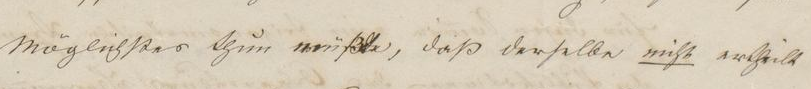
Möglichstes thun müßte, daß derselbe nicht ertheilt
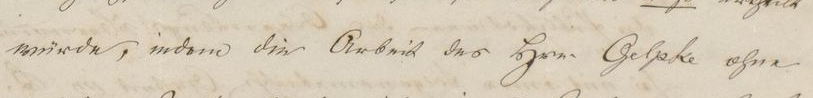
würde, indem die Arbeit des Hrn. Gelpke ohne
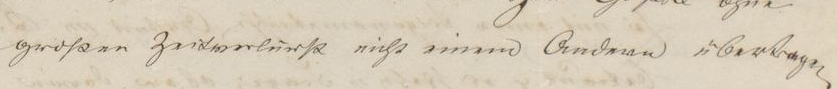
großen Zeitverlust nicht einem Andern übertragen
